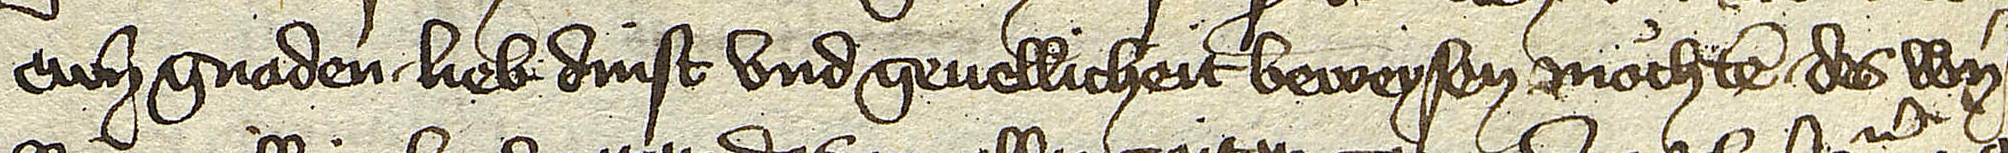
ewn* gnaden / lieb dinſt vnd geuellicheit beweyſen möchte* / des wn*
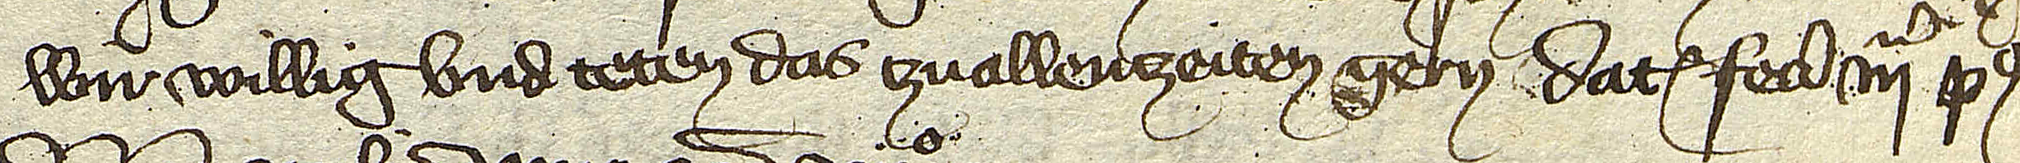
wir willig vnd teten das cʒu allencʒeiten gern / dat* fea* iii* p*
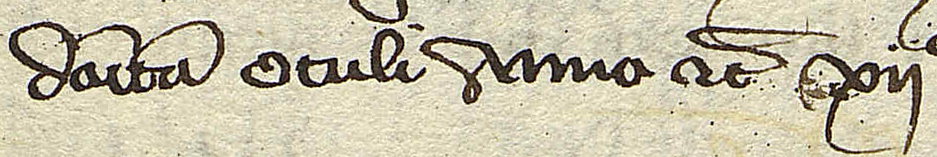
doica* Oculi Anno ec* xii*
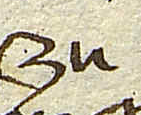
cʒu
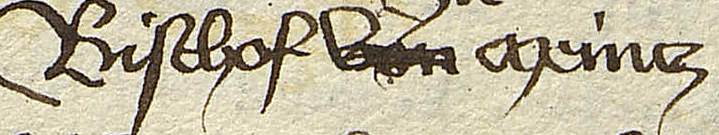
Biſchof von Meincʒ
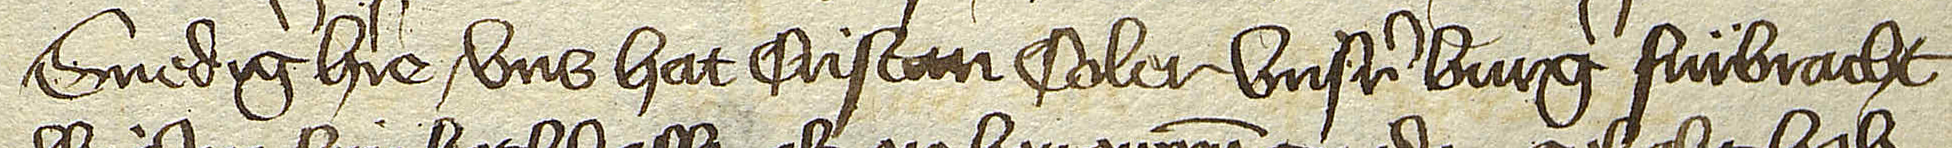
Gnedig* h*re / vns hat Criſtan Coler vnſr* burg* fürbracht
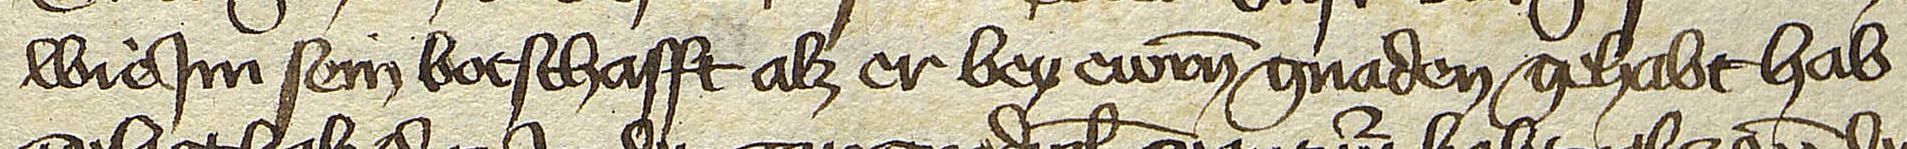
wie Im ſein botſchafft alʒ er bey ewrn* gnaden gehabt hab
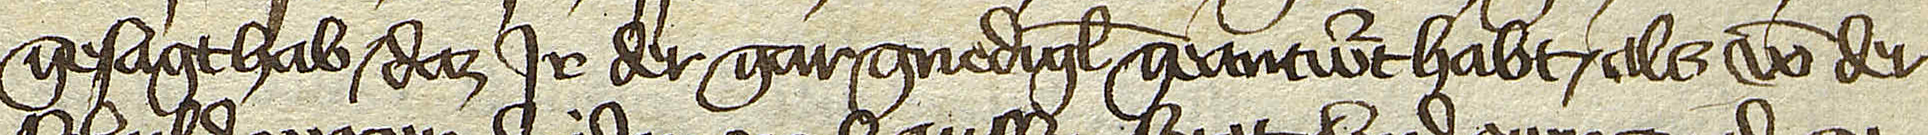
geſagt hab / daʒ Ir der gar gnedigl* geantwt* / als vo* der
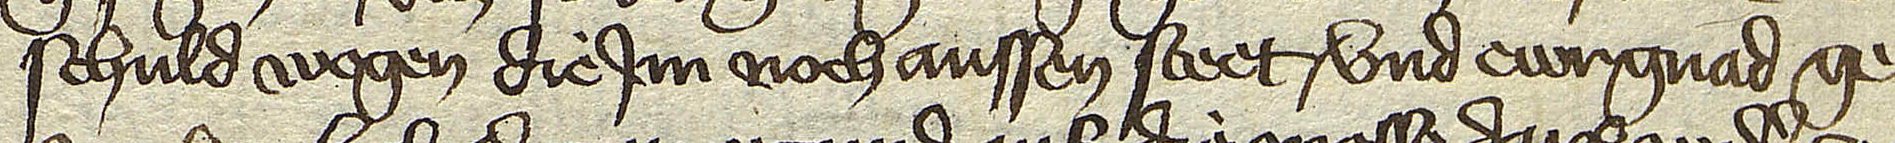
ſchuld wegen die Im noch auſſen ſteet / vnd ewr gnad ge
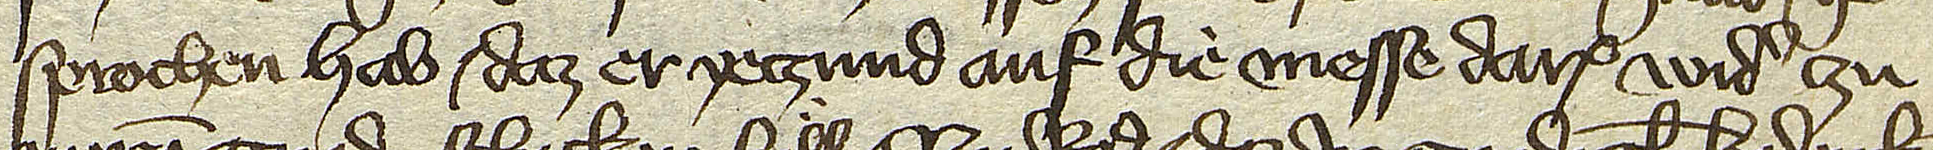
ſprochen hab / daʒ er yecʒund auf die meſſe dar* wid* cʒu
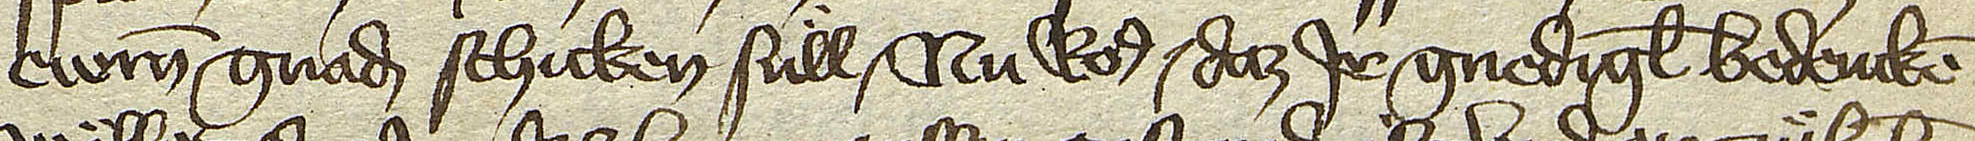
ewrn* gnad* ſchicken ſüll / Nu Ro* / daʒ Ir gnedigl* bedencke*
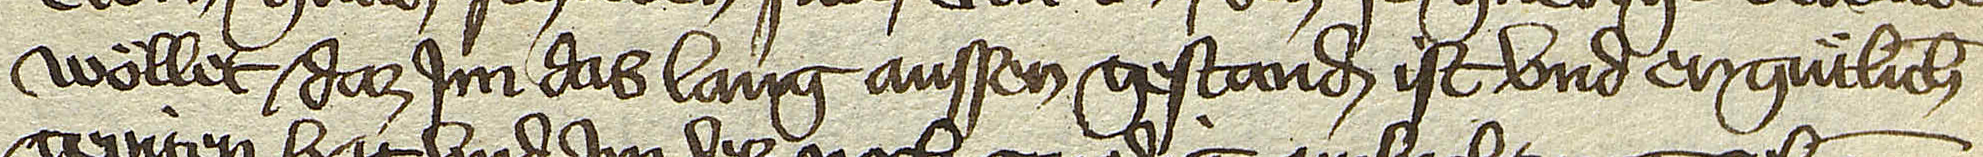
wöllet / daʒ Im das lang auſſen geſtand* iſt vnd er gütlich*
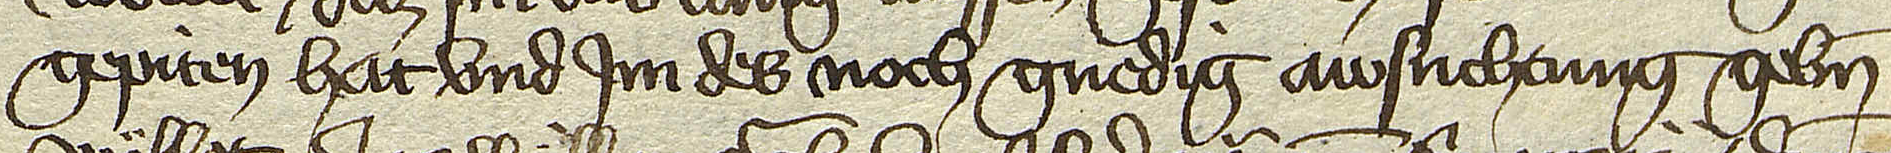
gepiten hat vnd Im des noch gnedig awſrichtung gebn*
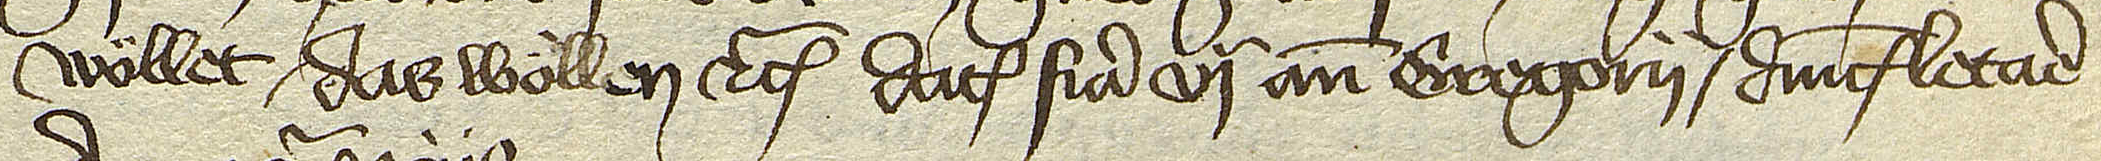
wöllet / das wöllen ec* dat* fia* vi* Gregorii / dnic* letae*
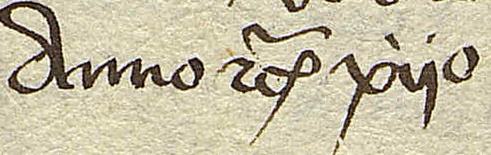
Anno ec* xii*
